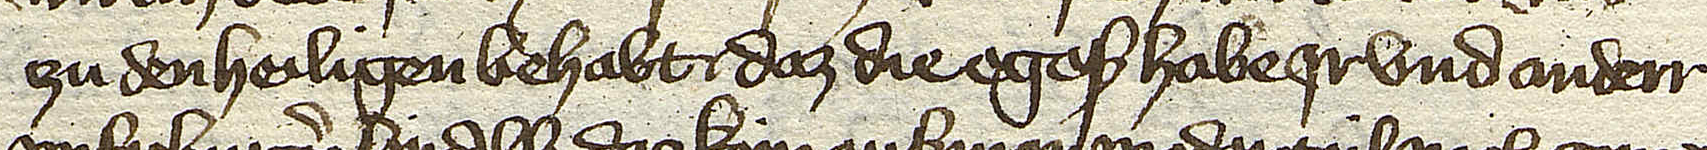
cʒu den heiligen behabt / daʒ die egeſ* habe Ir vnd anderr
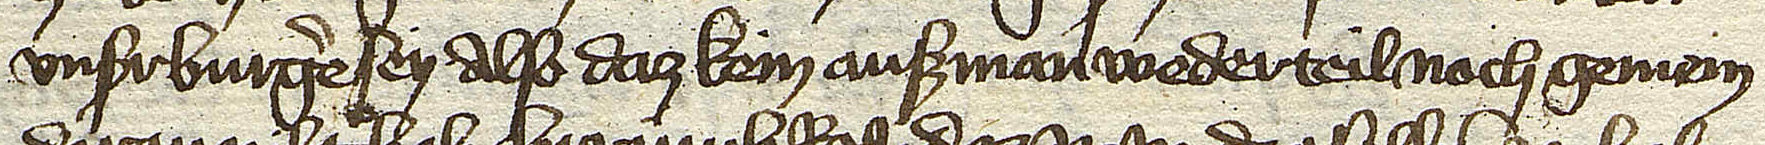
vnſ*r burge* ſey . Alſo daʒ kein auſʒman weder teil noch gemein
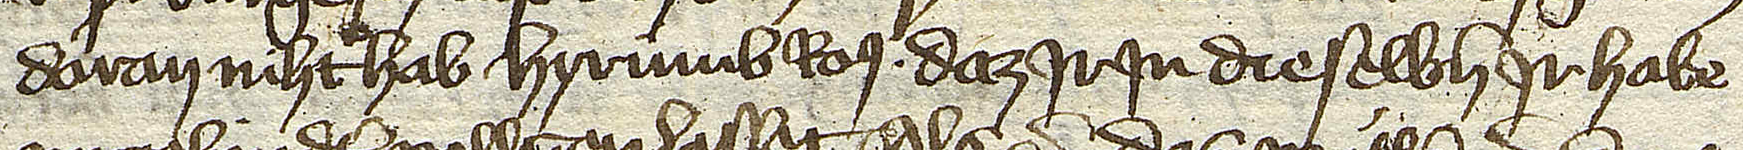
daran niht hab / hyrümb Ro* . daʒ Ir In dieſelb*n Ir habe
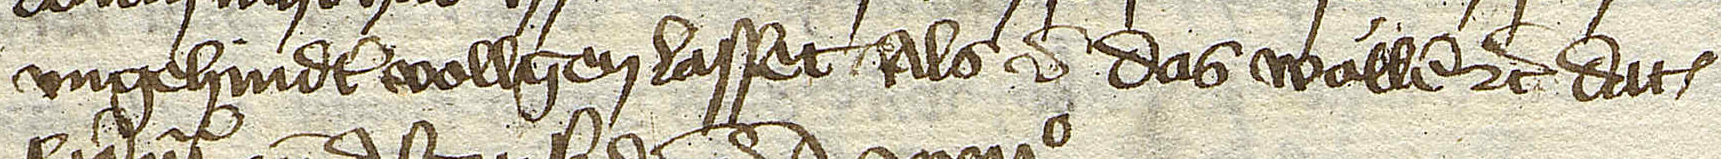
vngelind*t vollgen laſſet / Als ec* das wölle* ec* dat*
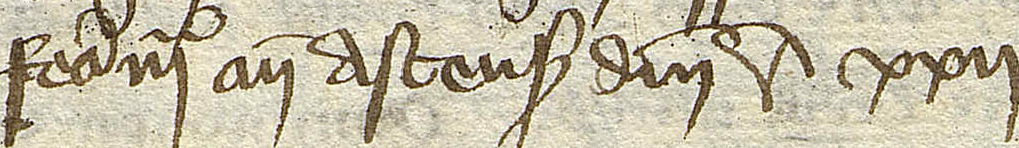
fea* iii* an* Aſcenſ* dni* A* xxii*
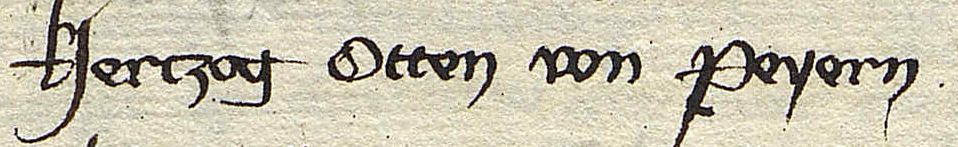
Hercʒog Otten von Peyern
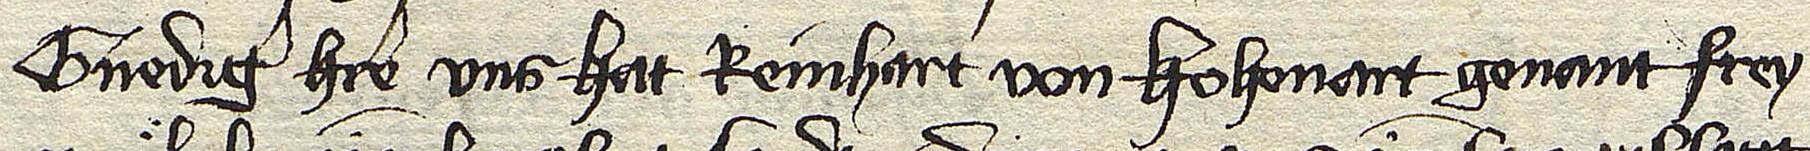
Gnedig* h*re vns hat Reinhart von Hohenart genant frey
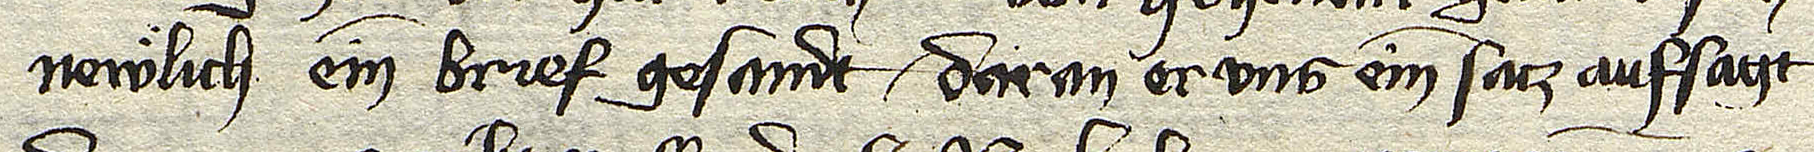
newlich ein* brief geſandt / daran er vns ein* ſacʒ aufſlagt
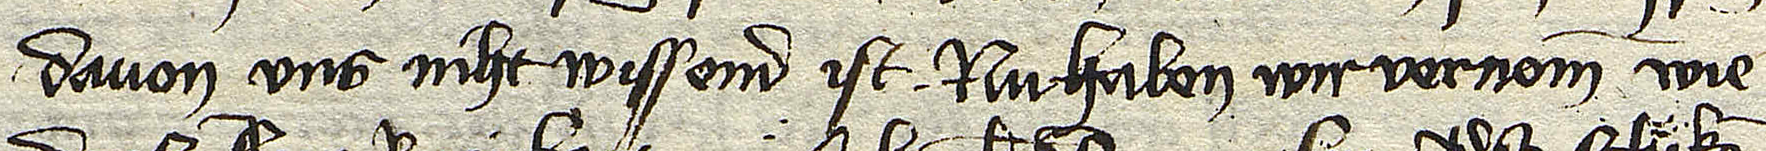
dauon vns niht wiſſend iſt . Nu haben wir vernom* wie
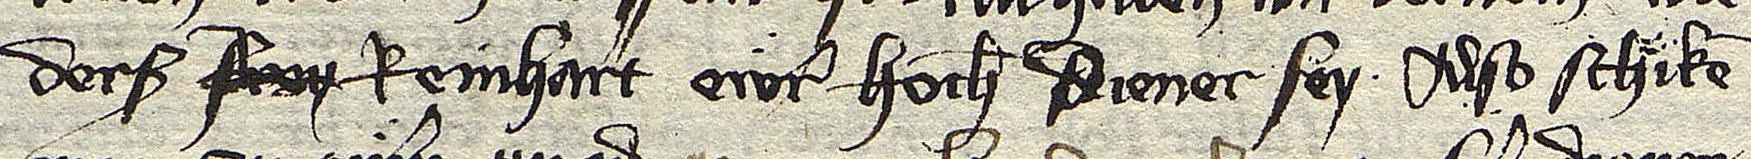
derſ* Frey Reinhart ew*r hoch* diener ſey . Alſo ſchike*
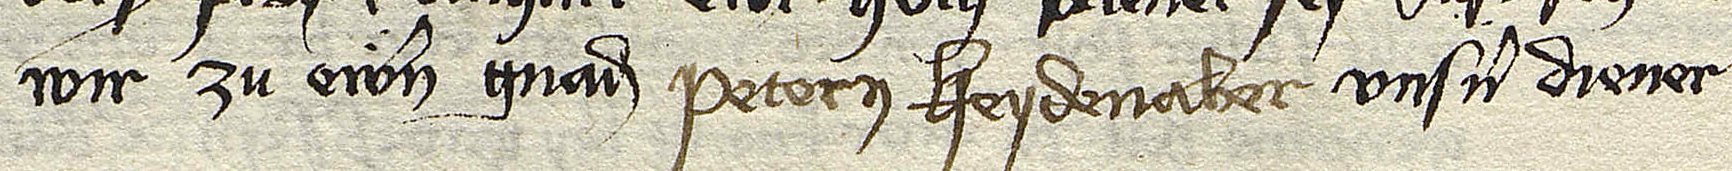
wir ʒu ew*n gnad* Petern Heydenaber vnſ*n diener
